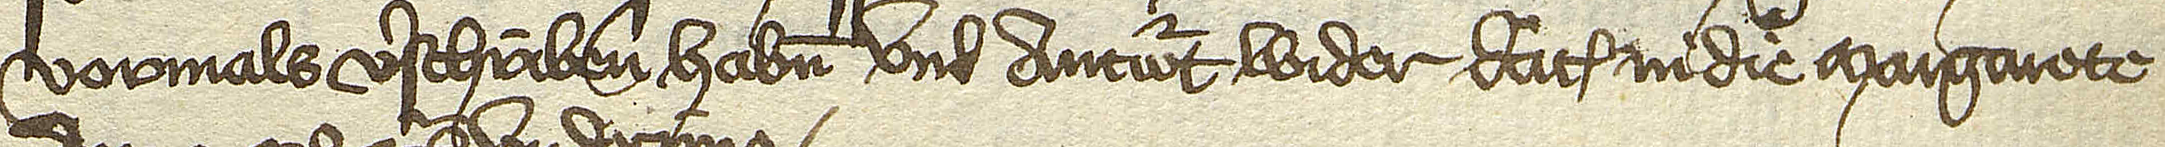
vormals v*ſchriben habn* vnd Antw*t wider dat* in die Margarete
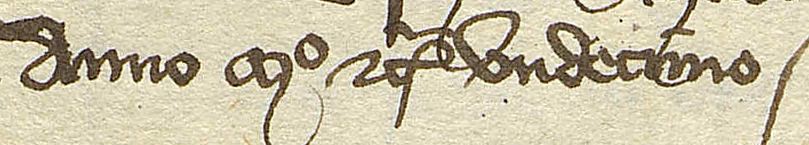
Anno M* ec* vndecimo /
